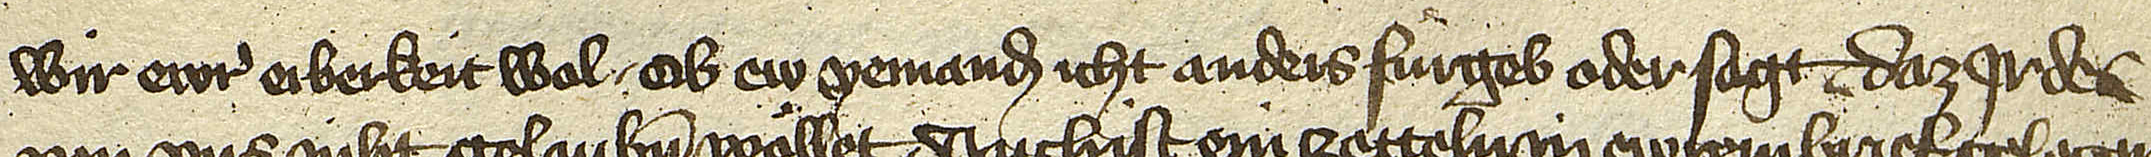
wir ewr* erberkeit wol / Ob ew yemand icht anders furgeb oder ſagt / daʒ Ir des
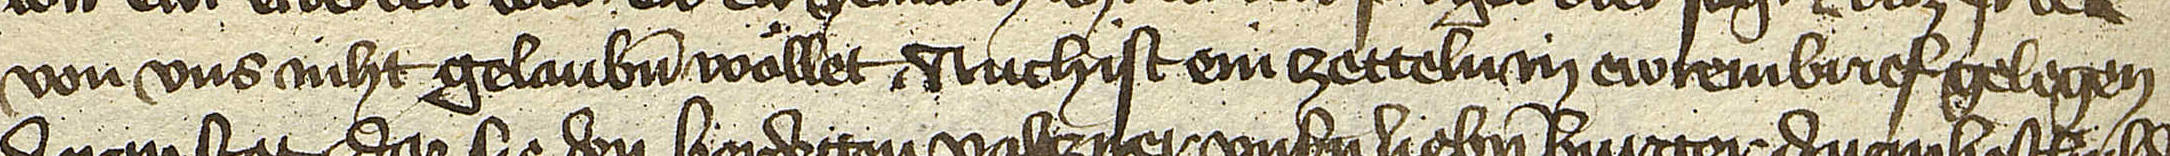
von vns niht gelaubn* wöllet / Auch iſt ein cʒetteln in ewrem brief gelegen
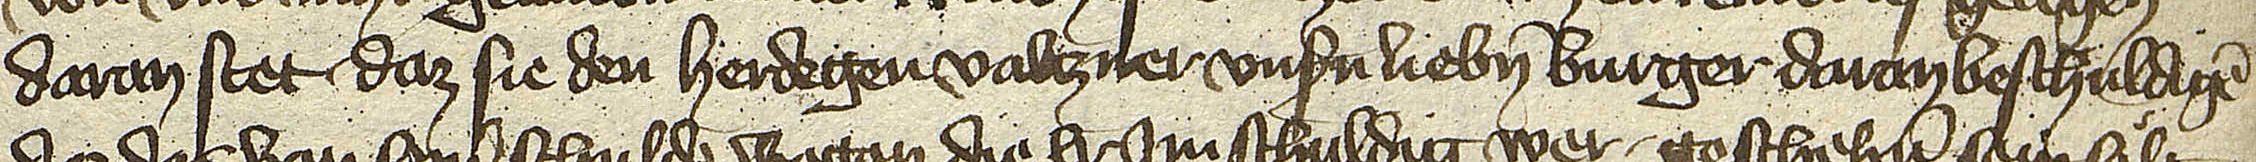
daran ſtet / daʒ ſie den herdegen valcʒner vnſ*n liebn* Burger daran beſchuldige*
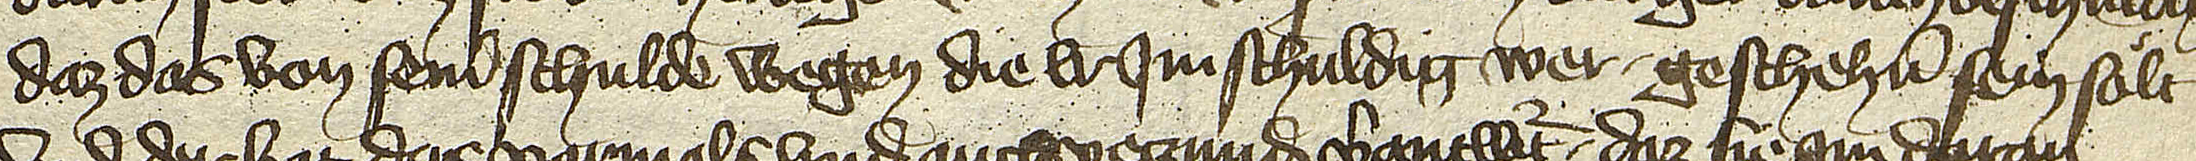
daʒ das von ſein* ſchulde wegen die Er Im ſchuldig wer / geſchehn* ſein ſölt
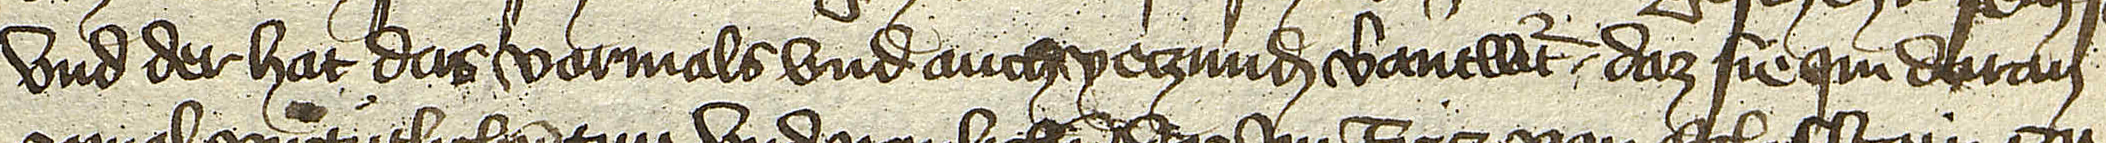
vnd der hat das vormals vnd auch yecʒund* v*antwt* / daʒ ſie Im daran
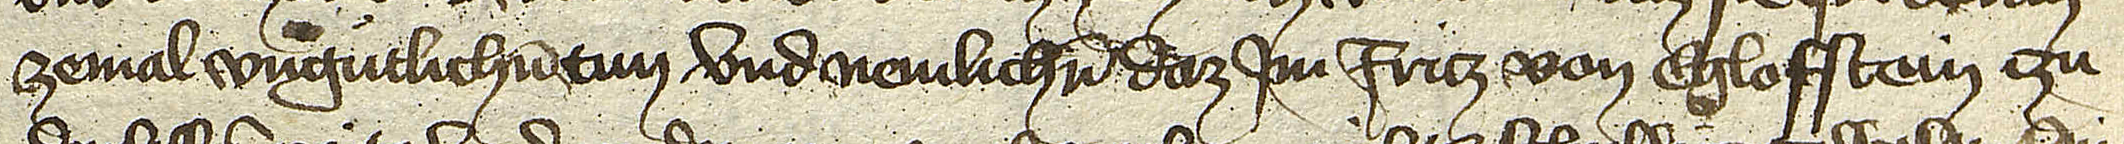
cʒemal vngütlichn* tun / vnd nemlichn* daʒ Im Fricʒ von Eglofſtein cʒu
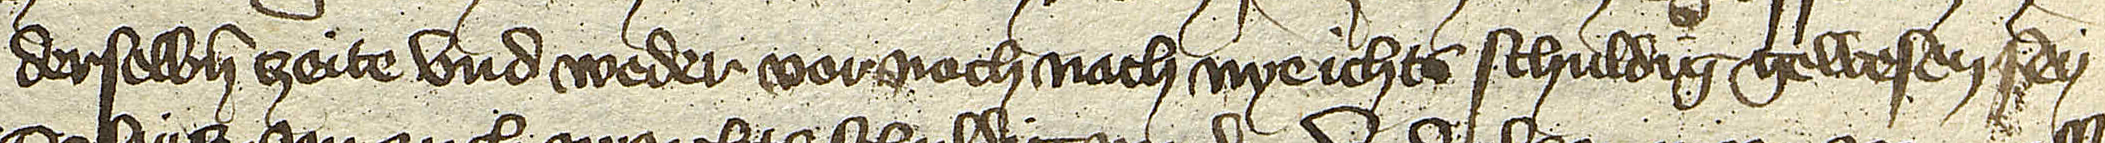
derſelbn* cʒeite vnd weder vor noch nach nye ichts ſchuldig geweſen ſey
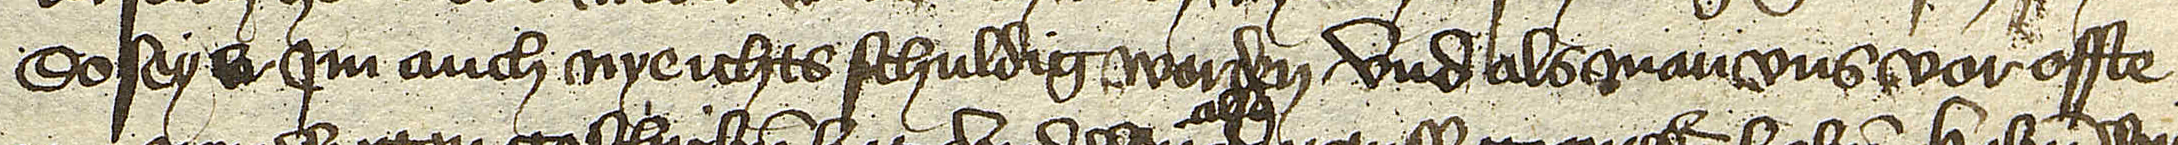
So ſey Er Im auch nye ichts ſchuldig worden / vnd als man vns vor offte
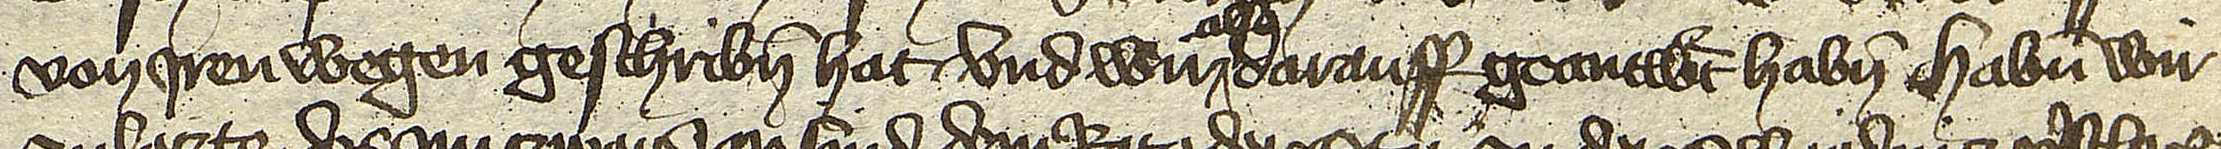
von Iren wegen geſchribn* hat / vnd wir darauff geantwt* habn* / habn* wir
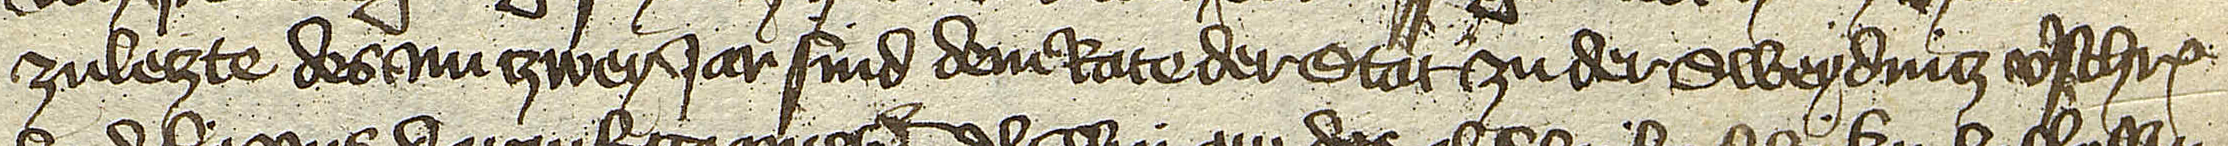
cʒulecʒte des nu cʒwey Iar ſind dem Rate der Stat cʒu der Sweydnicʒ v*ſchr*
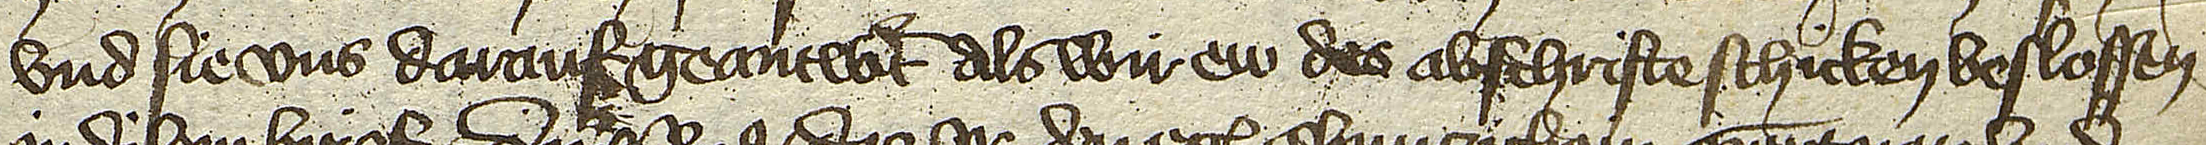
vnd ſie vns darauf geantwt* als wir ew des abſchrift ſchicken beſloſſen
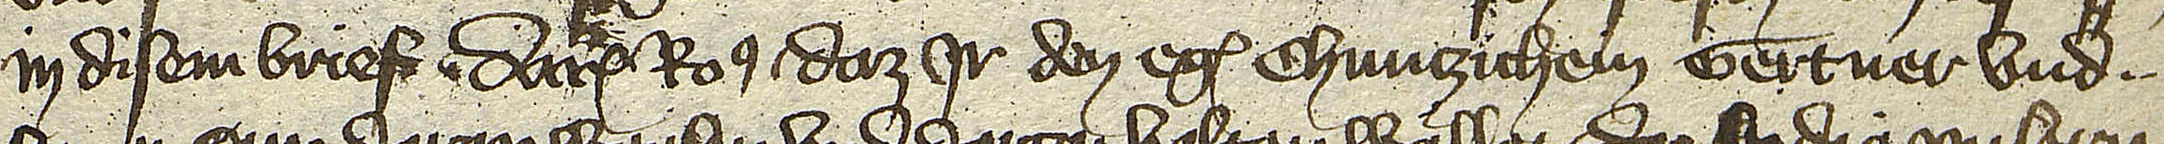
in diſem brief / Dar* Ro* / daʒ Ir den eg* Chuncʒichein Gertner vnd
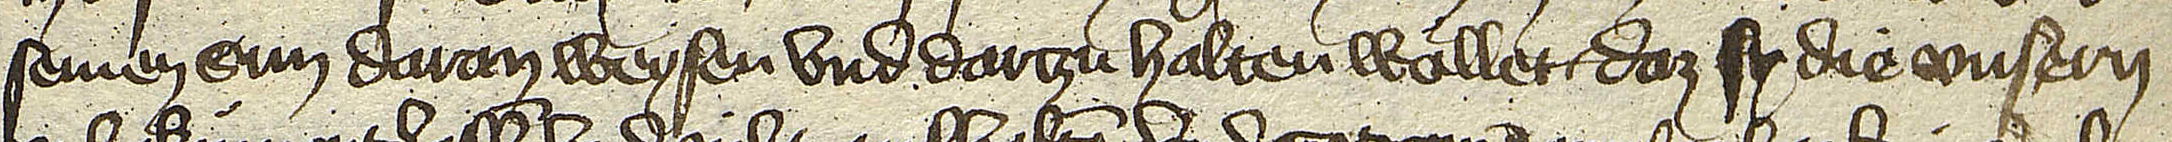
ſeinen Sun daran weyſen vnd darcʒu halten wöllet / daʒ ſy die vnſern
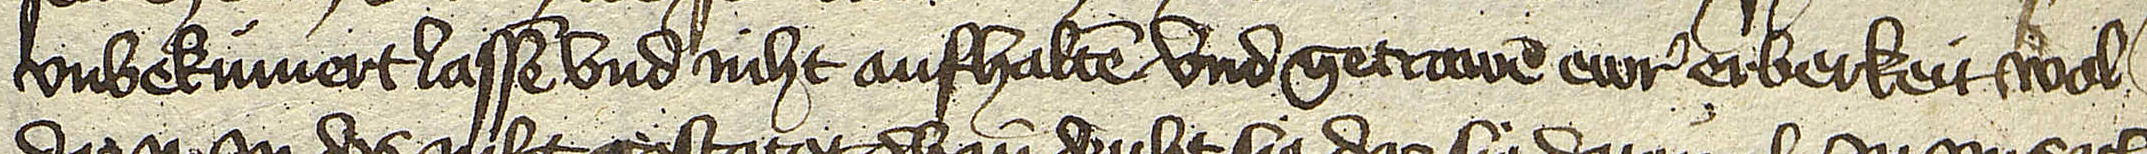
vnbekümert laſſe* vnd niht aufhalte* / vnd getrawe* ewr* erberkeit wol
